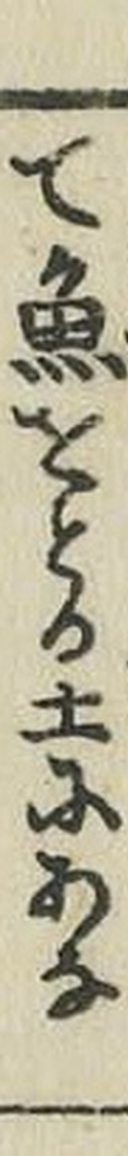て魚をとる土にあな
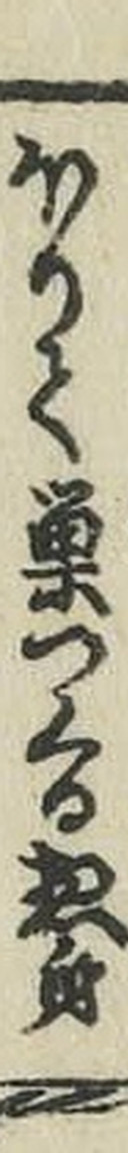ほりて巣つくる惣身
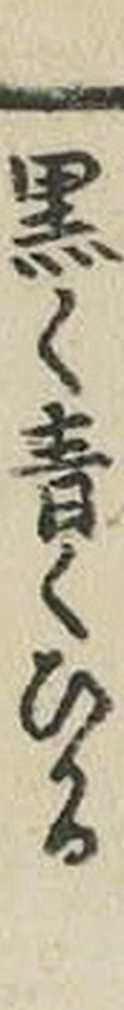黒く青くひかる

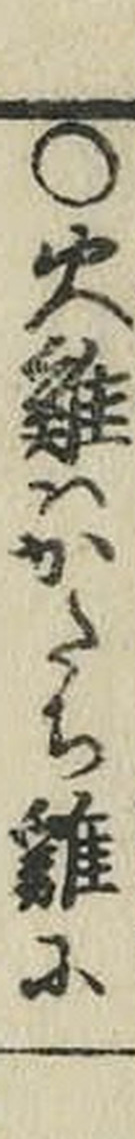○火鶏はかたち鶏に
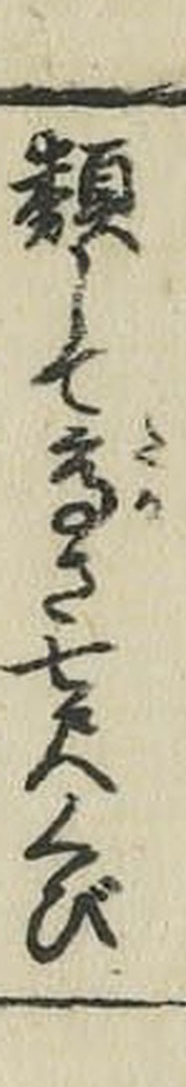類して高さ七尺くび
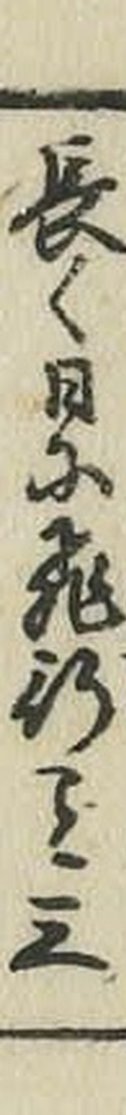長く日に飛行こと三
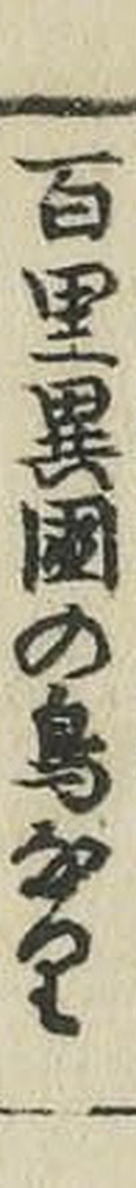百里異国の鳥なり
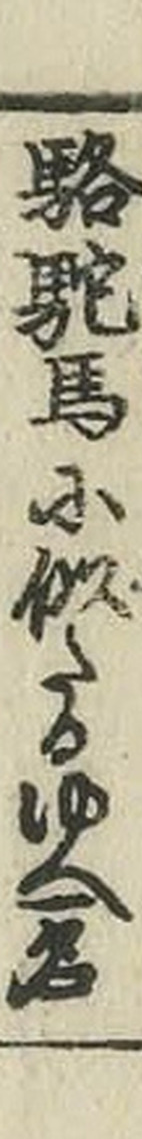駱駝馬に似たるゆへ一名
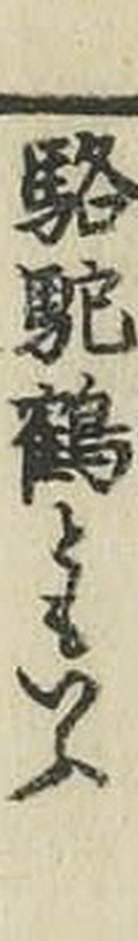駱駝鶴ともいふ
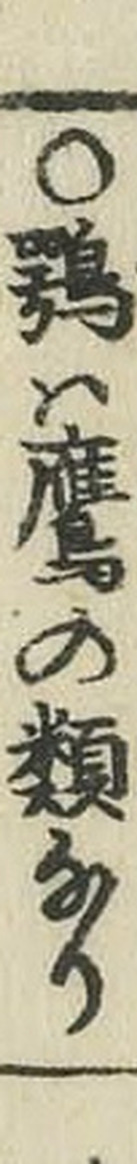○鶚は鷹の類なり
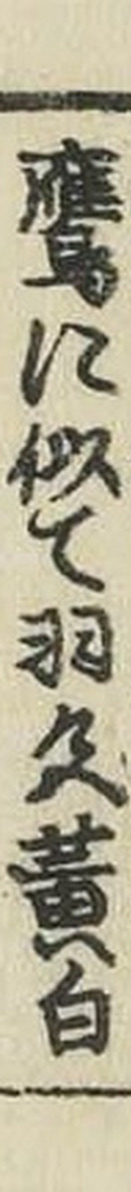鷹に似て羽色黄白
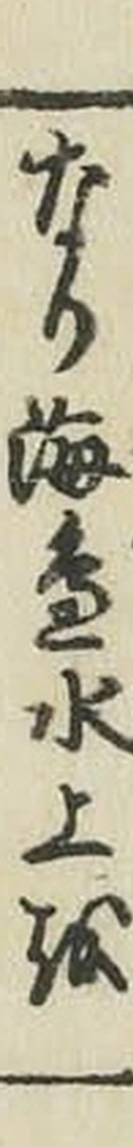なり海辺水上を
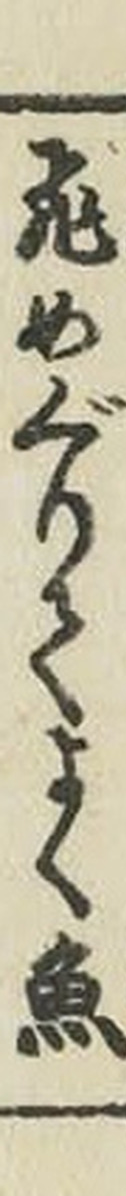飛めぐりてよく魚
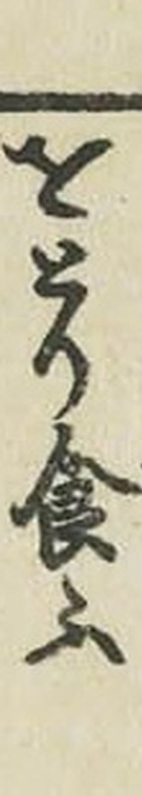をとり食ふ
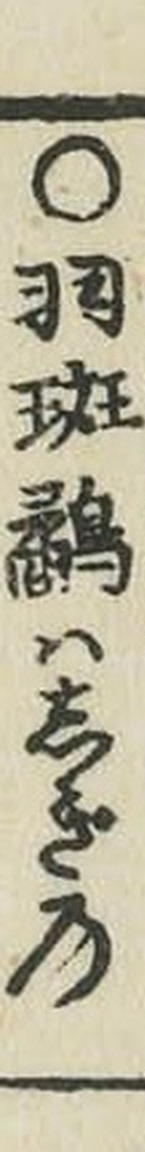○羽斑鷸はしぎの
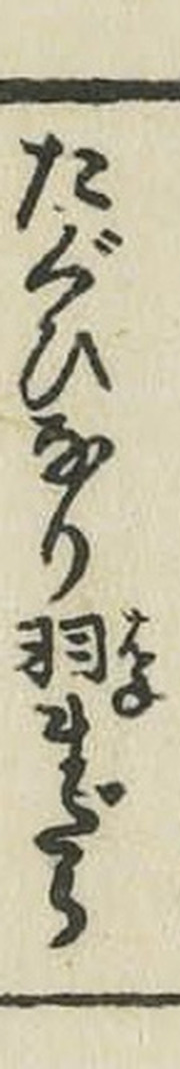たぐひなり羽まだら
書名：増補頭書訓蒙図彙大成 10巻 6:巻之12-13
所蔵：東京学芸大学教育コンテンツアーカイブ
